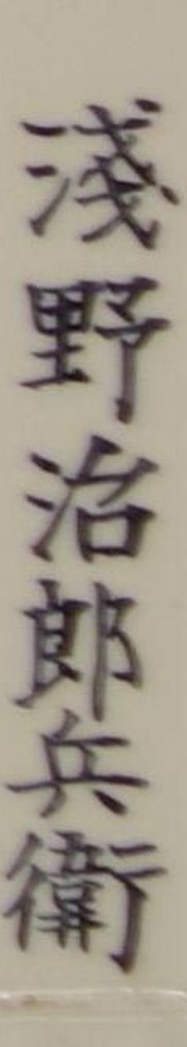浅野治郎兵衛
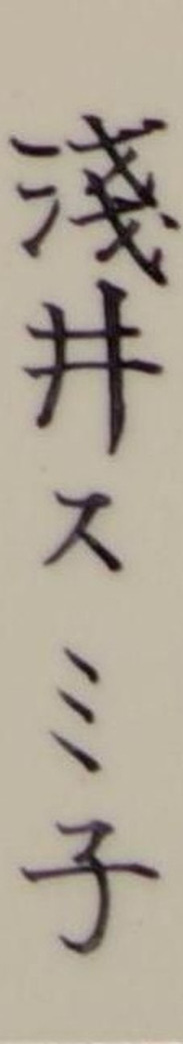浅井スミ子
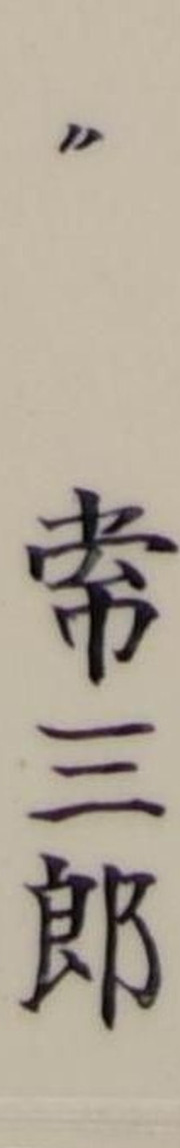常三郎
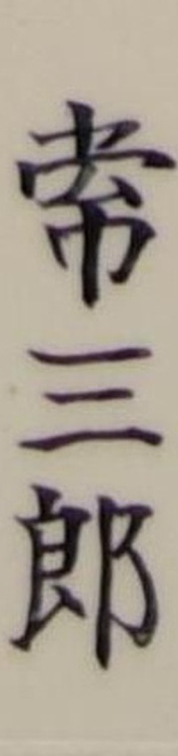常三郎
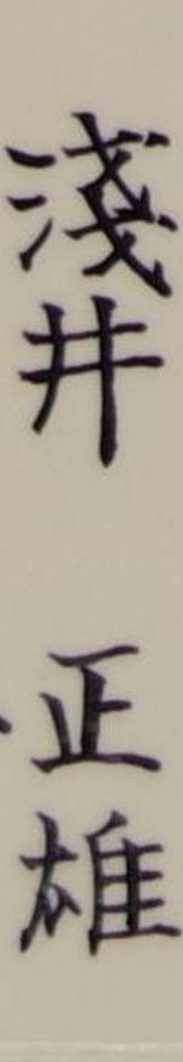浅井正雄
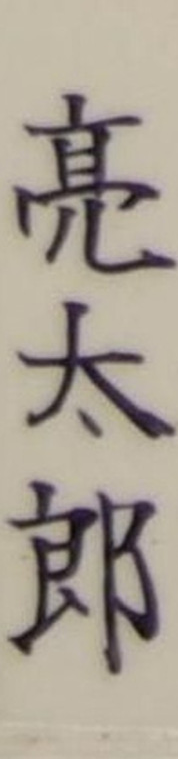亮太郎

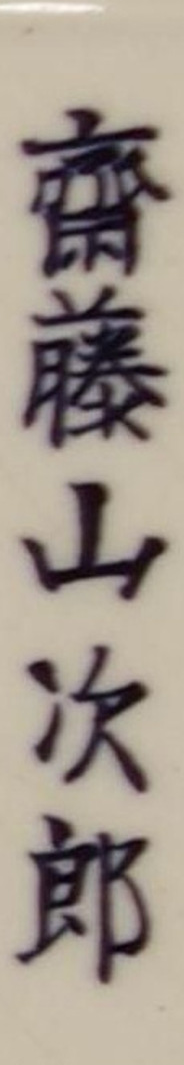斉藤山次郎
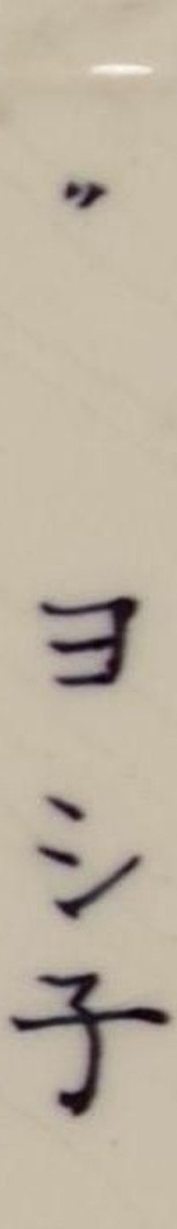ヨシ子
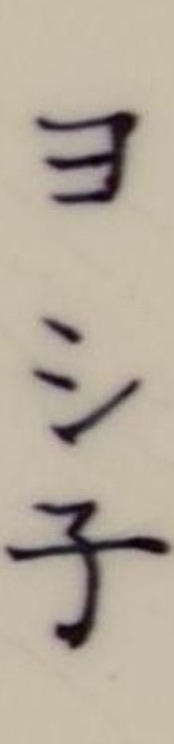ヨシ子
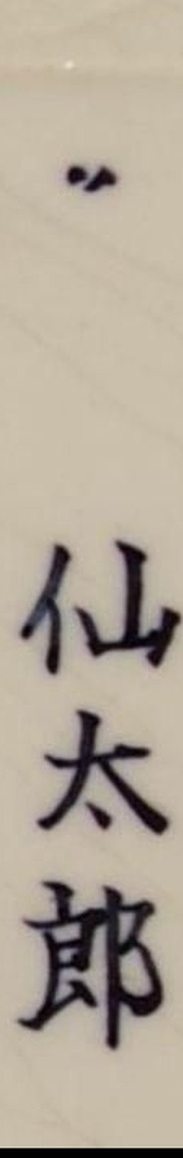仙太郎
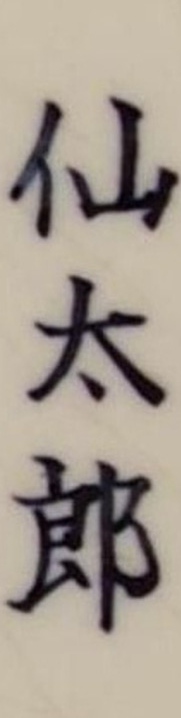仙太郎
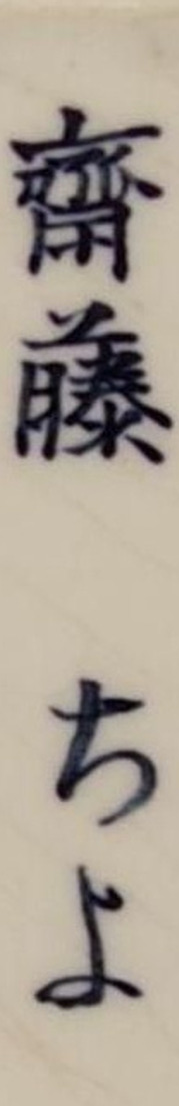斎藤ちよ
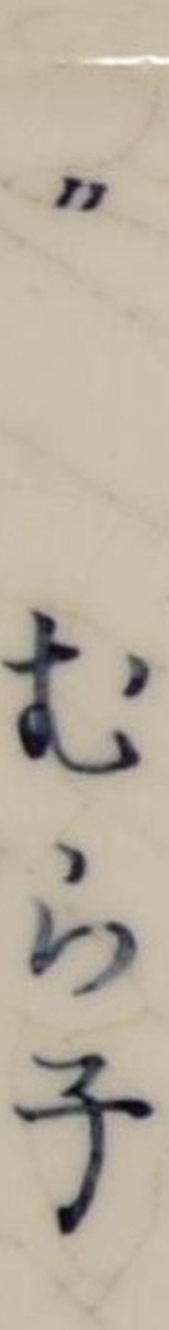むら子
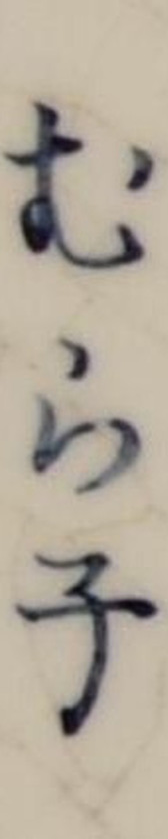むら子
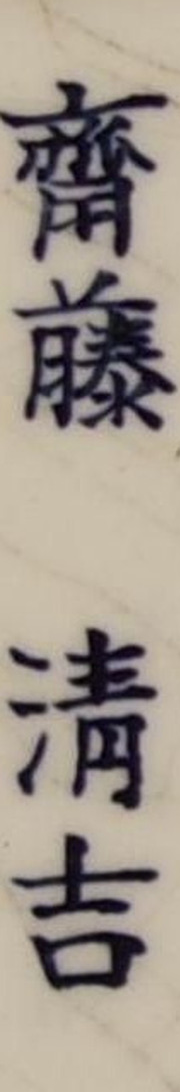斉藤清吉
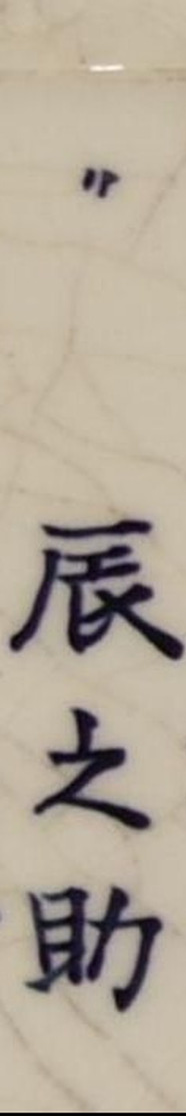辰之助
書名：E~L
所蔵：高野山金剛峯寺
